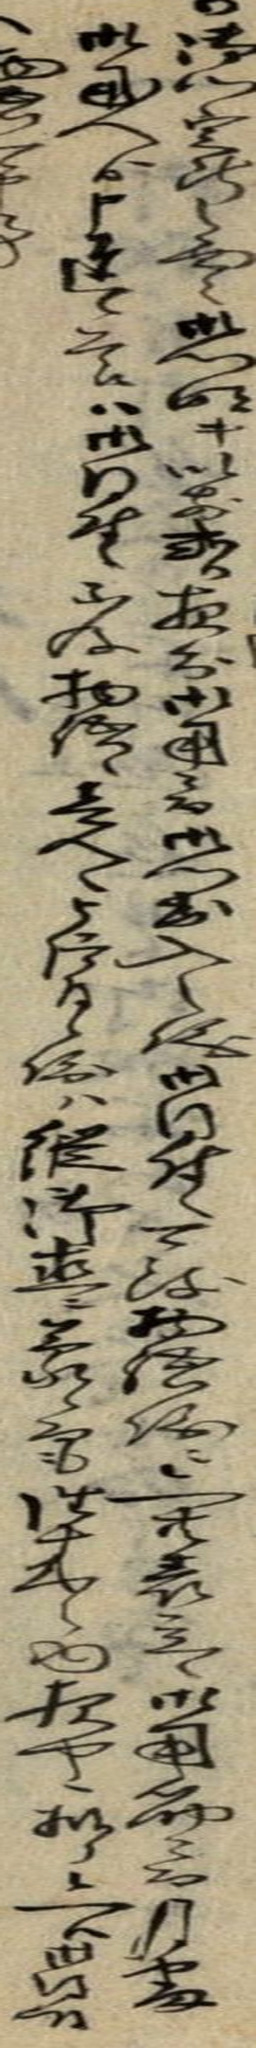御用人ゟ申達候節は御目付へ不及物語候壱人へ被仰付候儀は縦御直に蒙候ても往来之内夜中に掛り候へは御目付
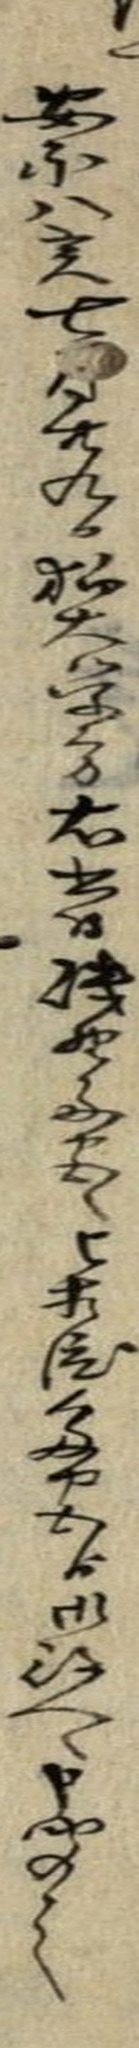安永八亥七月廿九日狛大学方右書付磯野多宮へ被相渡多宮ゟ御役人へ申聞之
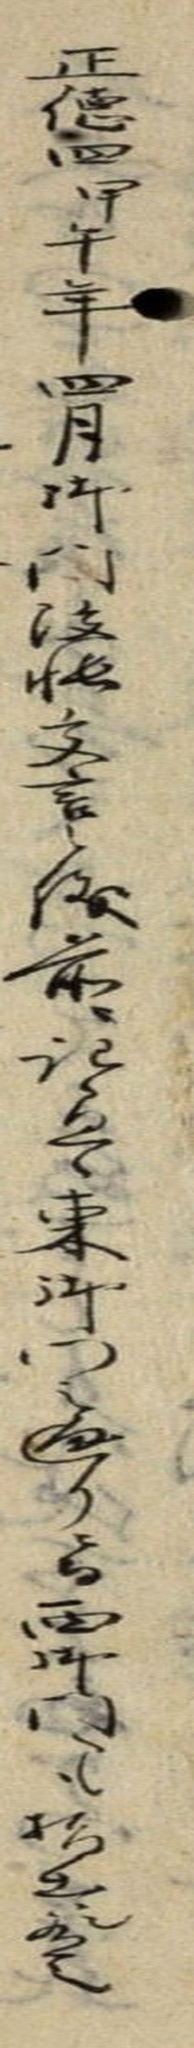正徳四甲午年四月御門改帳文言之儀前に記置候東御門之通りにて西御門へも指出し有之
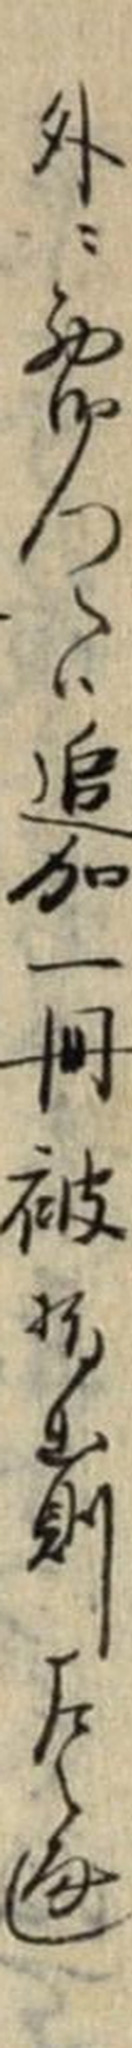外に西御門へは追加一冊被指出則左之通
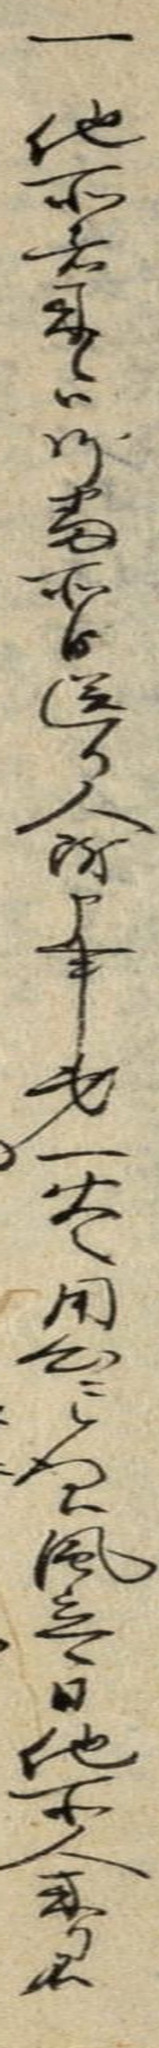一他所者来候は御番所ゟ送り人附申事第一火之用心に候得は風立候日他所人来り不
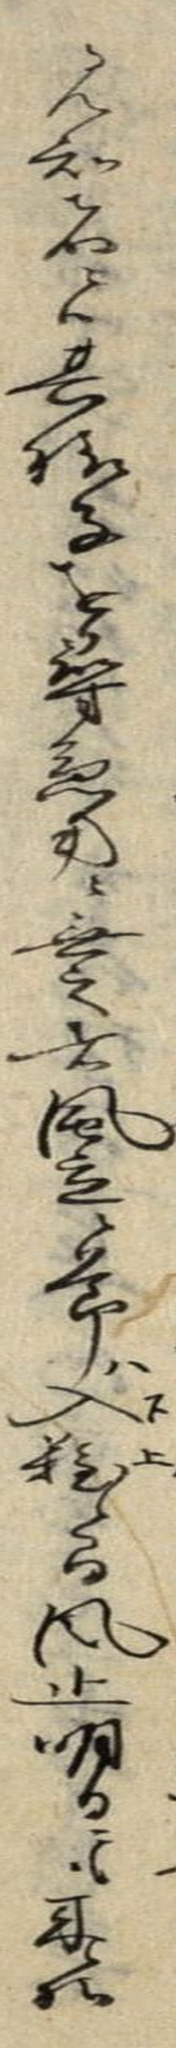見知者には其様子を尋急用に無之は風立候節は入難候間風止明日にも来候様
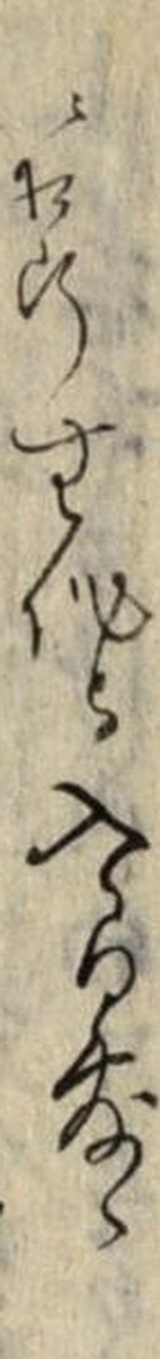に相断無作と入間敷候
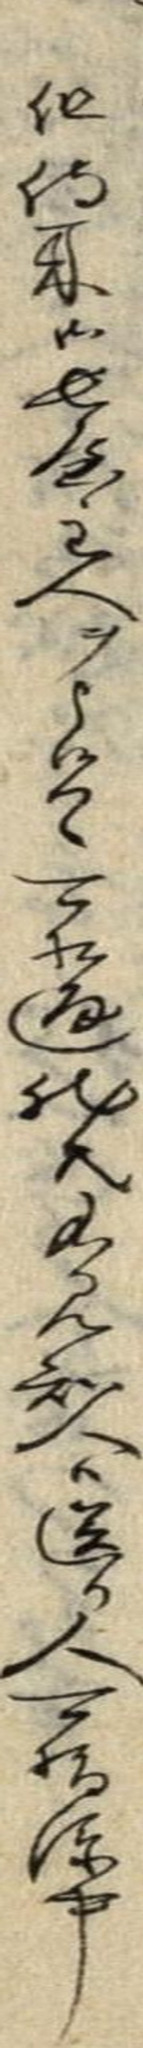但侍来御長屋主人を申候はゝ可相通然共不見知人は送り人可指添事
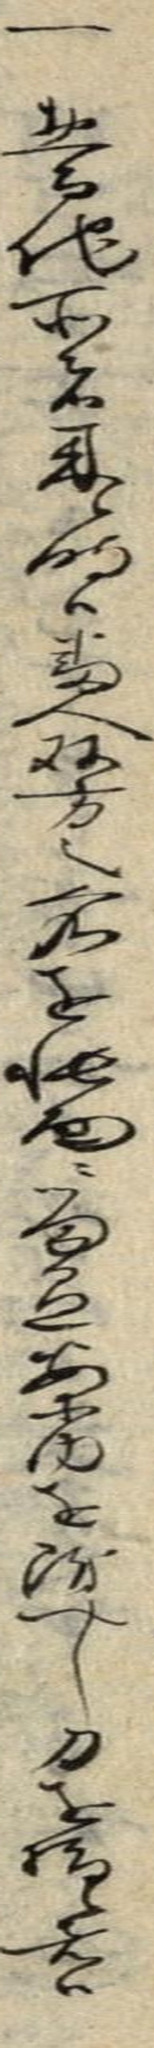一惣て他所者来候時は番人双方の名を帳面に留置案内を附へし刀を指候者は
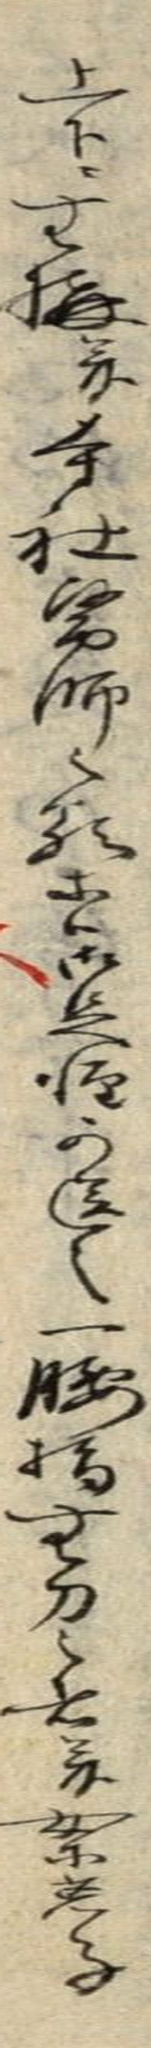上下に無構幷寺社医師之類等は御足軽可送之一腰指無刀之者幷女等荒子
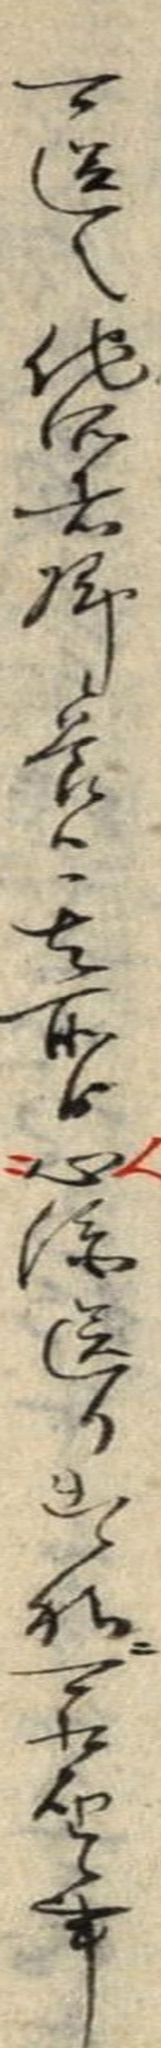可送之他所者帰候節は其所ゟ心添送り出候様に可相届候事
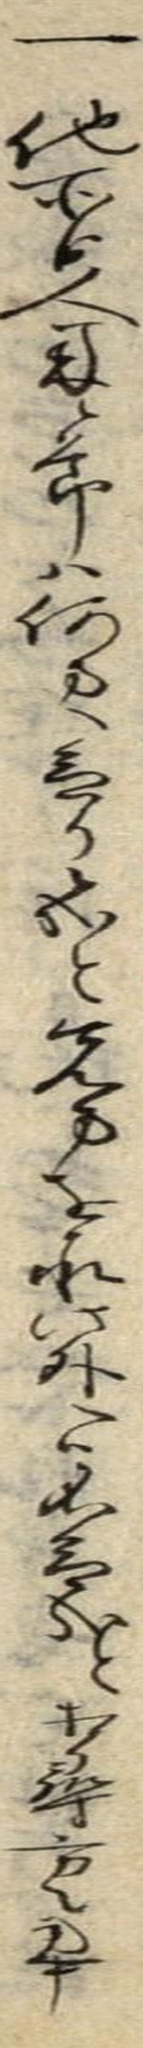一他所ゟ人来候節は何方へ参り候哉と先方を承此外へは不参哉と相尋方々用事
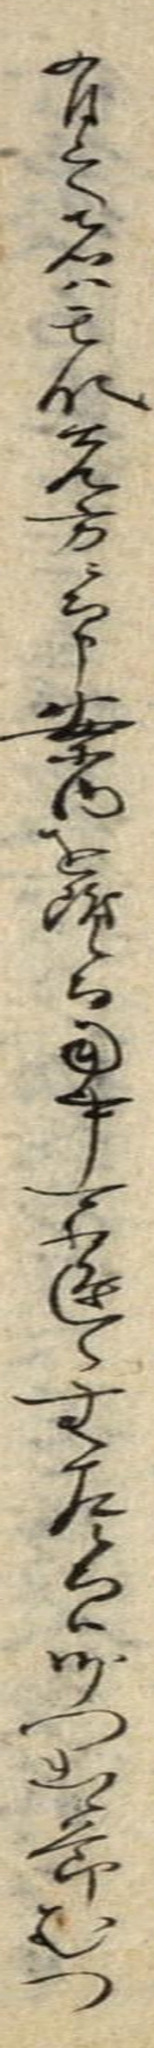有之者は其段先方にて申案内を附候て用事可相達候無左候ては御門出候節むつ
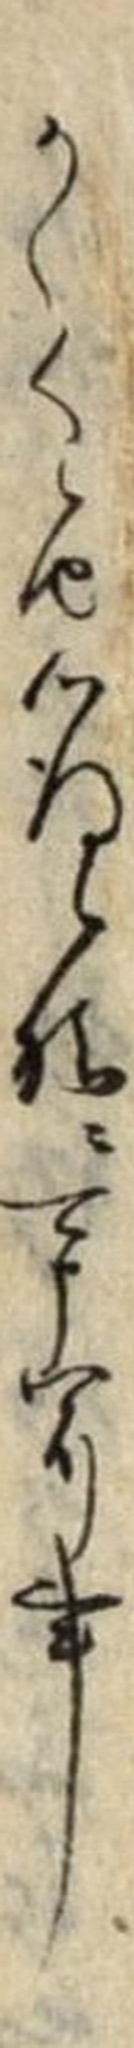かしく候由心得候様に可申聞事
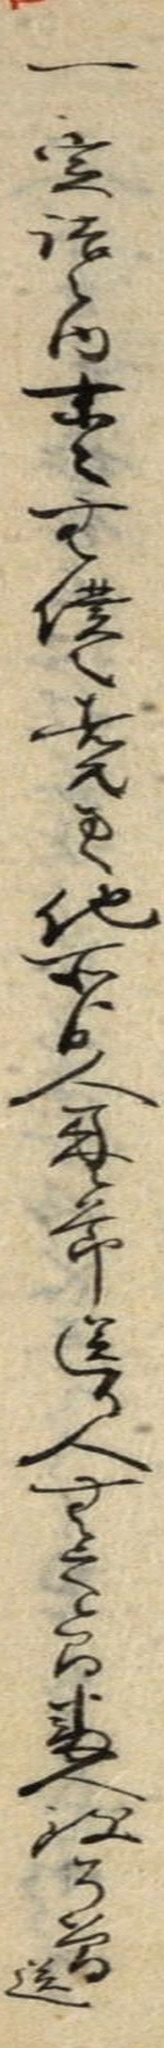一定詰之内末々無僕之者共方へ他所ゟ人来候節送り人無之候間番人致了簡送

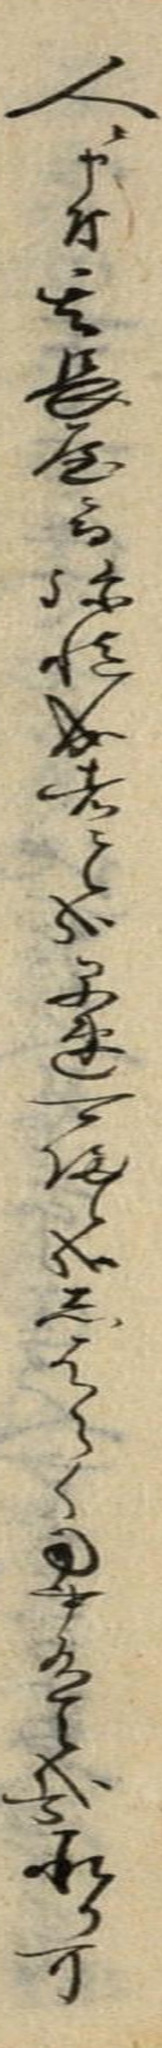人に申付其長屋にて弥慥成者に候哉早速可渡候哉しはらく用事有之哉承り可
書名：三都并道中之部
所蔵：福井県文書館 Fukui Prefectural Archives
